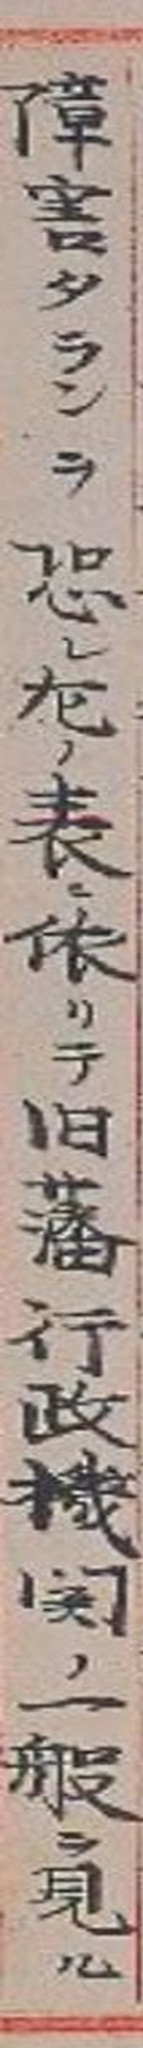障害タランヲ恐レ左ノ表ニ依リテ旧藩行政機関ノ一般ヲ見ル

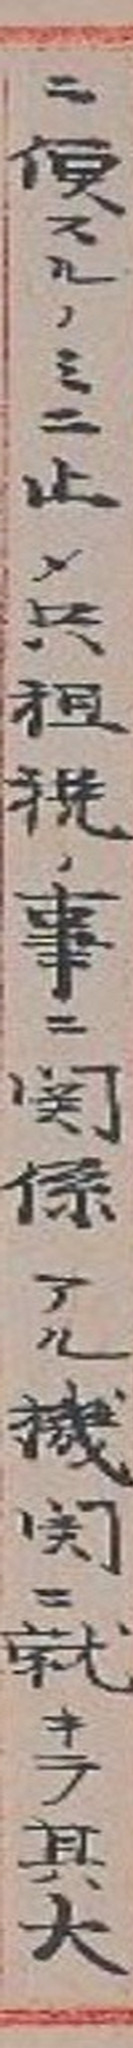ニ便スルノミニ止メ只租税ノ事ニ関係アル機関ニ就キテ其大
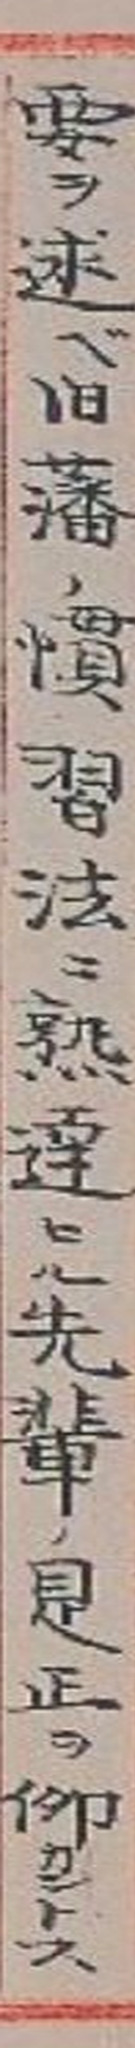要ヲ述ベ旧藩ノ慣習法ニ熟達セル先輩ノ是正ヲ仰カントス

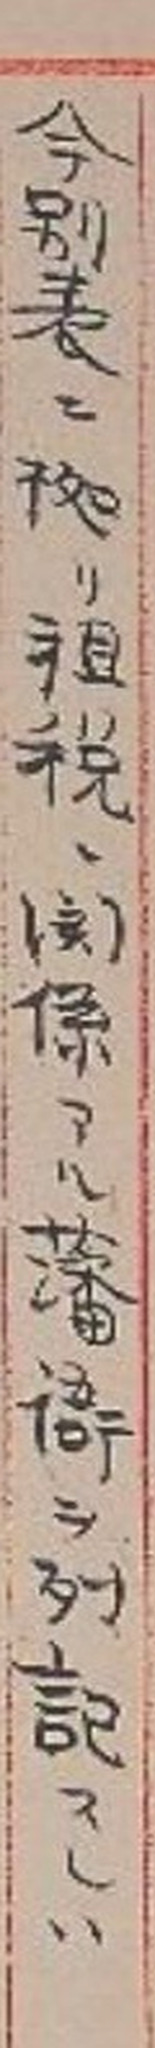今別表ニ拠リ租税ニ関係アル藩衙ヲ列記スレハ
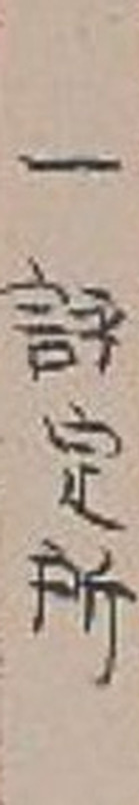一評定所
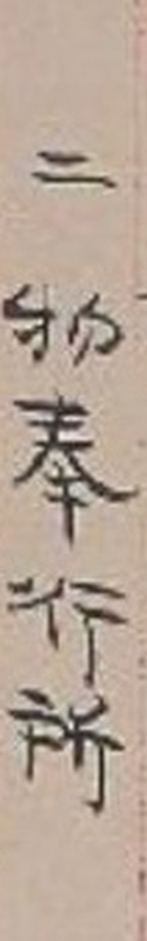二物奉行所
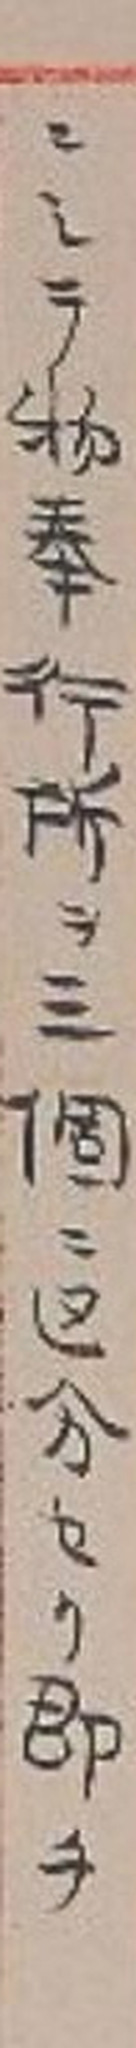ニシテ物奉行所ヲ三個ニ区分セリ即チ
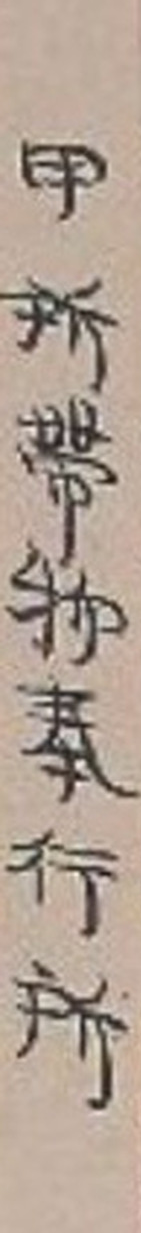甲所帯物奉行所
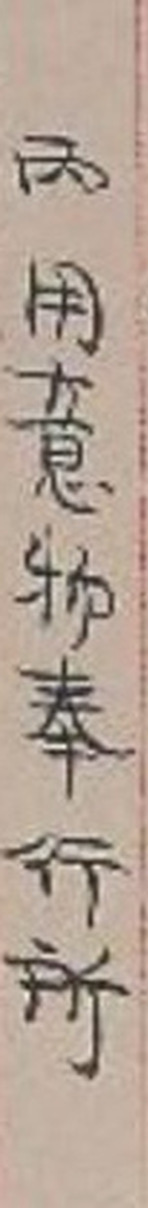丙用意物奉行所
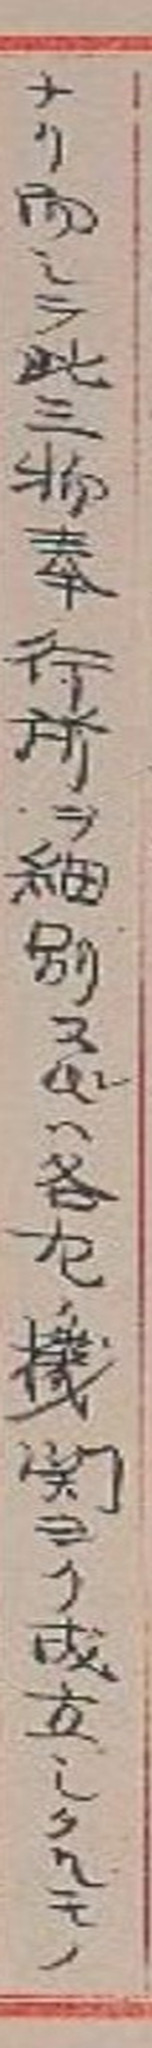ナリ而シテ此三物奉行所ヲ細別スレハ各左ノ機関ヨリ成立シタルモノ
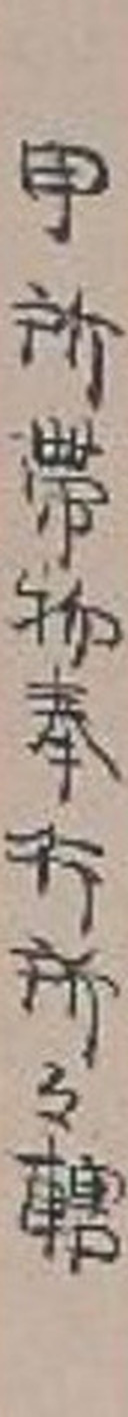甲所帯物奉行所々轄
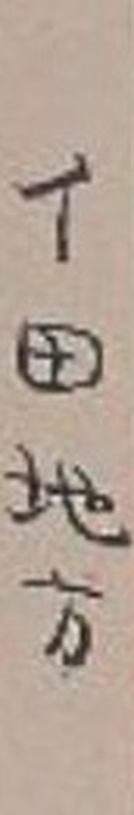イ田地方
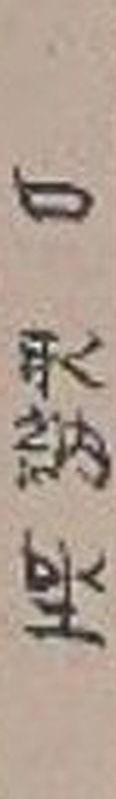ロ取納坐

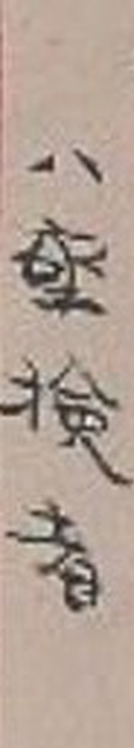ハ座検者
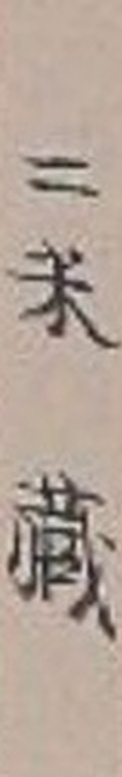ニ米蔵
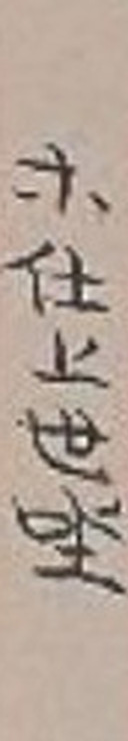ホ仕上世坐
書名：旧藩中租税徴収ニ関スル事項
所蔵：University of the Ryukyus Library
